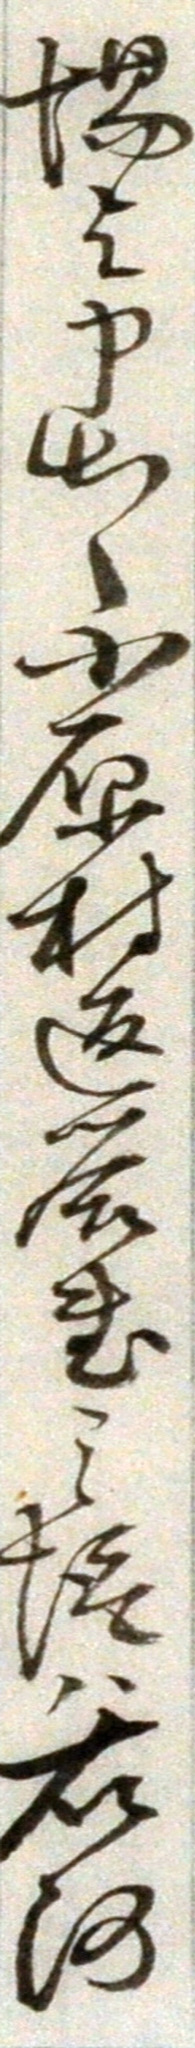場と申出候小原村返答書之趣ハ右河
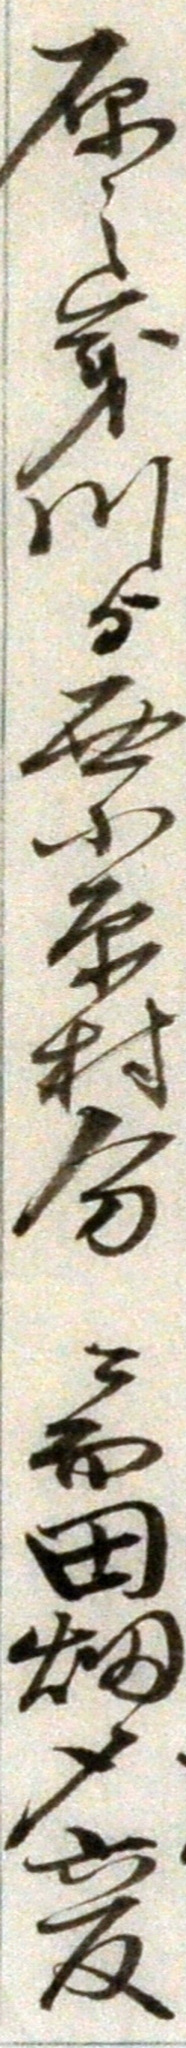原之義川ゟ西小原村分ニ而田畑〆六反
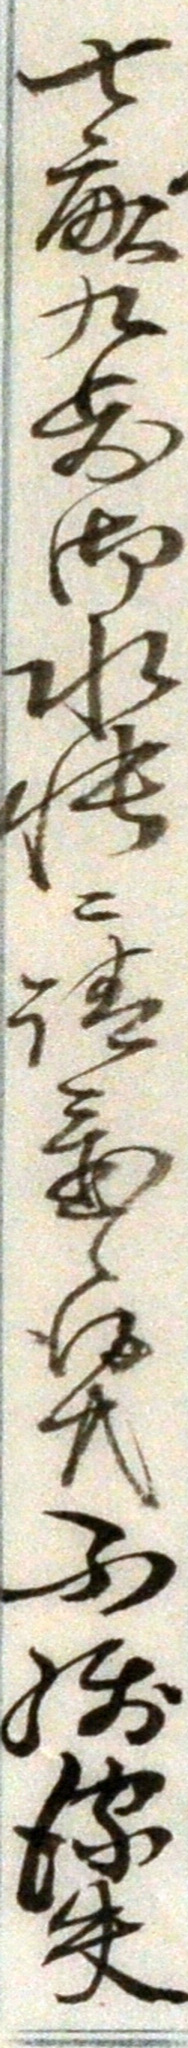七畝九歩御水帳ニ請置候得共不残流失
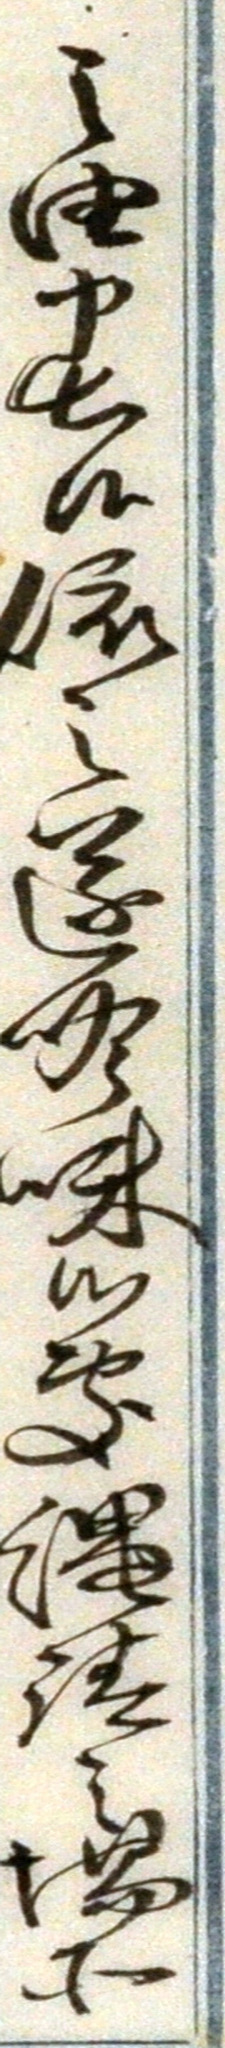之由申出候依之遂吟味候処縄請之場所
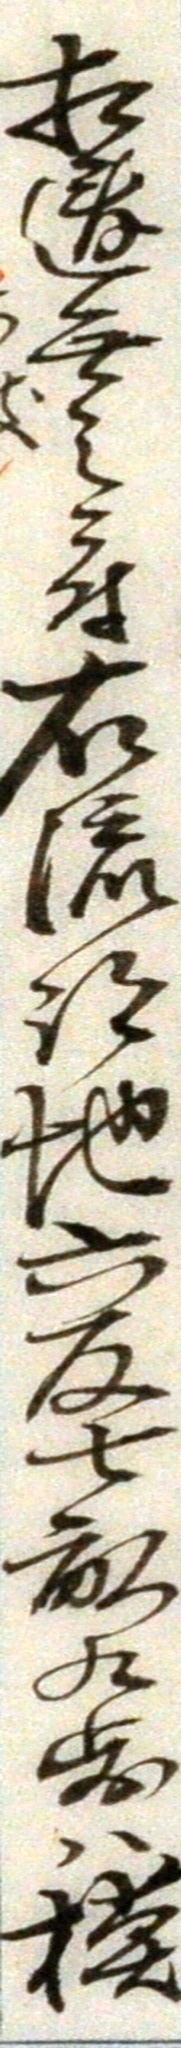相違無之ニ付右流跡地六反七畝九歩ハ模
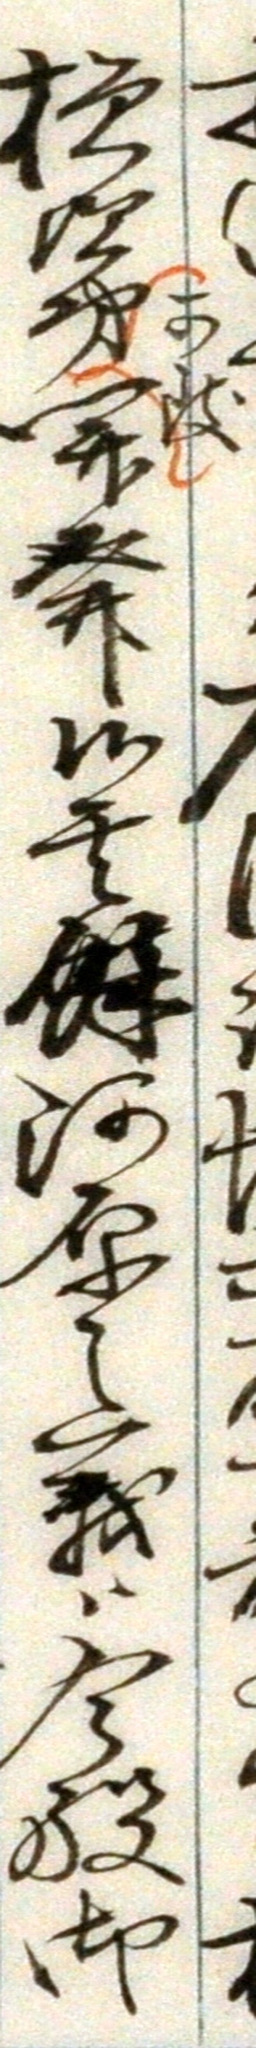様次第開発候其余河原之義ハ今般御
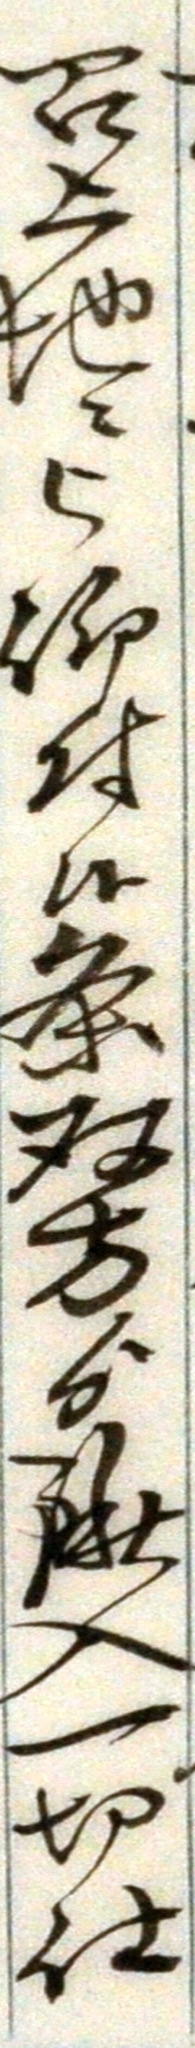召上地ニ被仰付候条双方ゟ鍬入一切仕
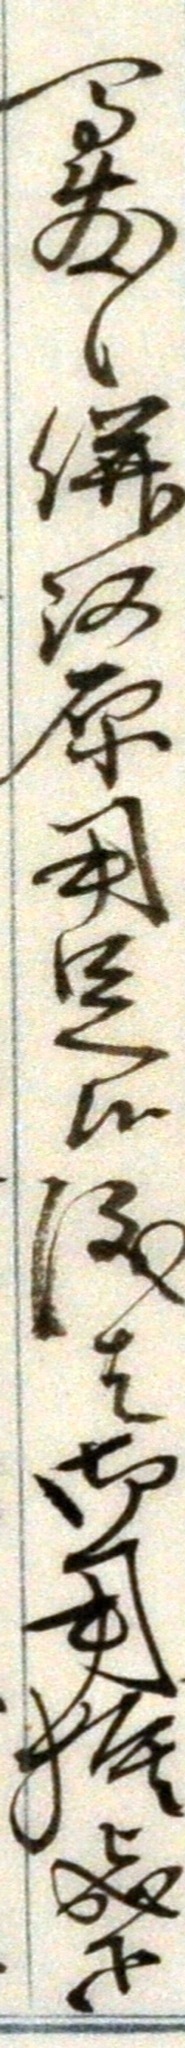間敷候併河原用足候儀は御用捨被成下候
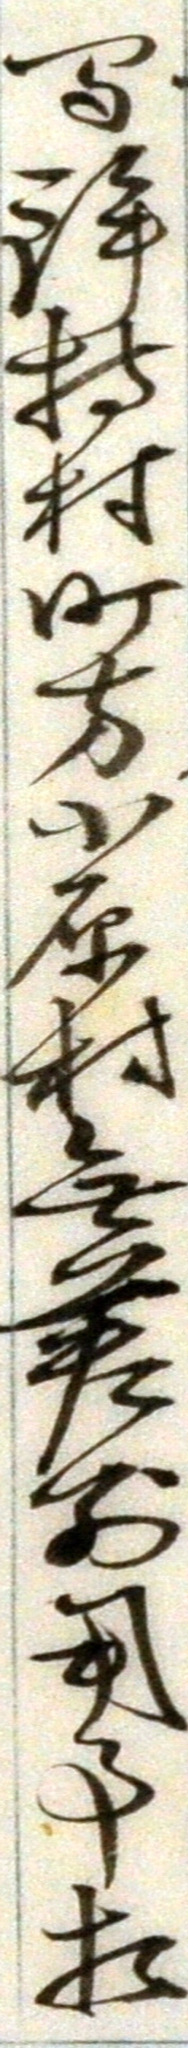間鉾持村町方小原村無差別用事相
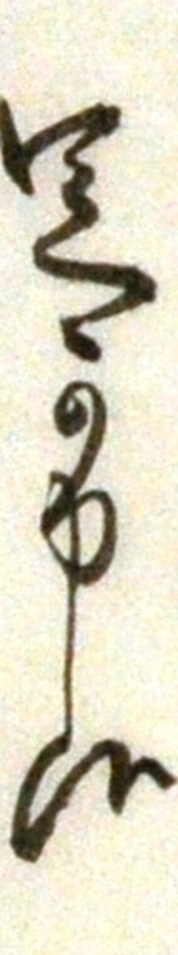足可申候
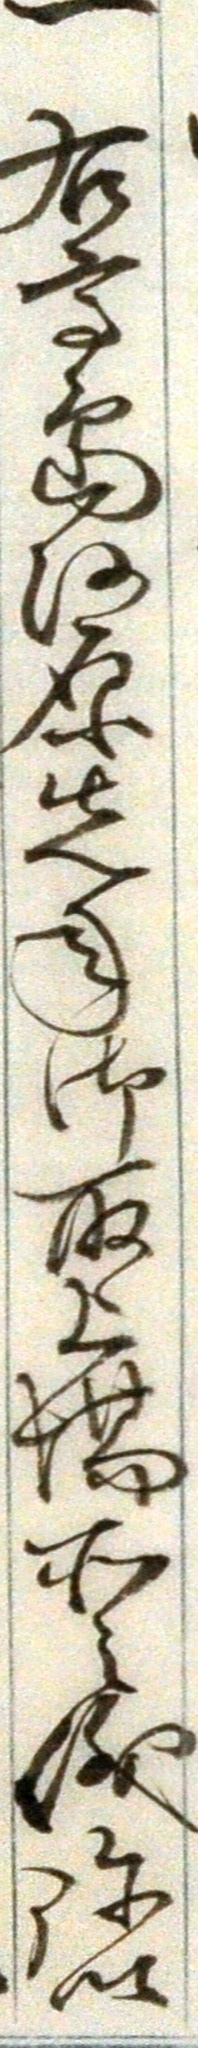一右高島河原先年御取上場所之儀弥以
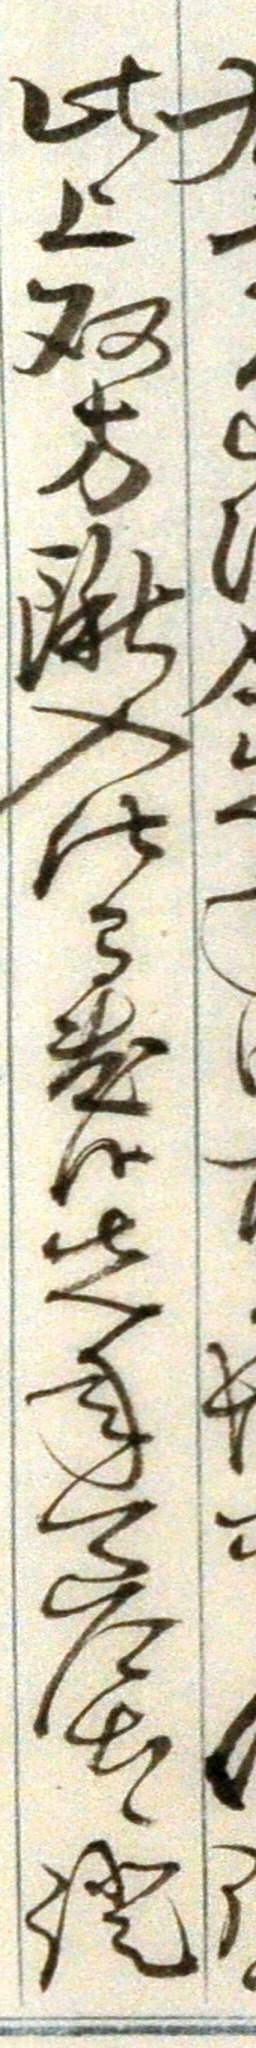此上双方鍬入仕間敷候先年差出候証
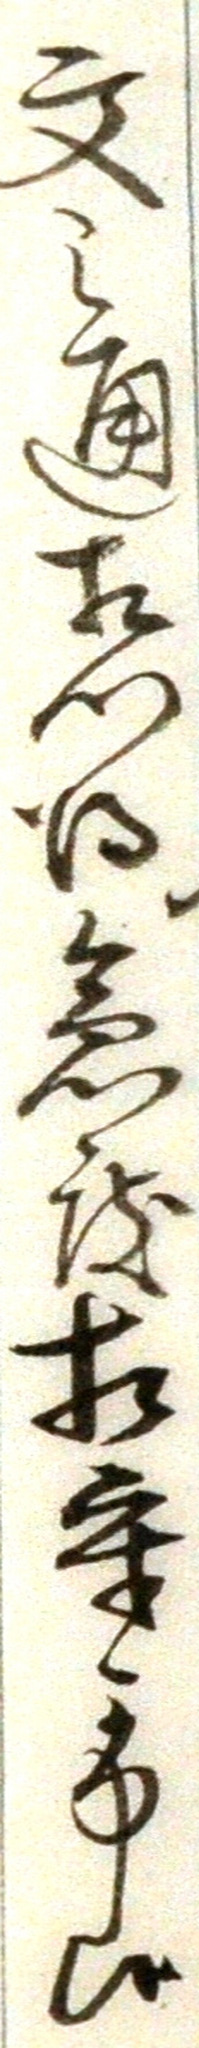文之通相心得急度相守可申候

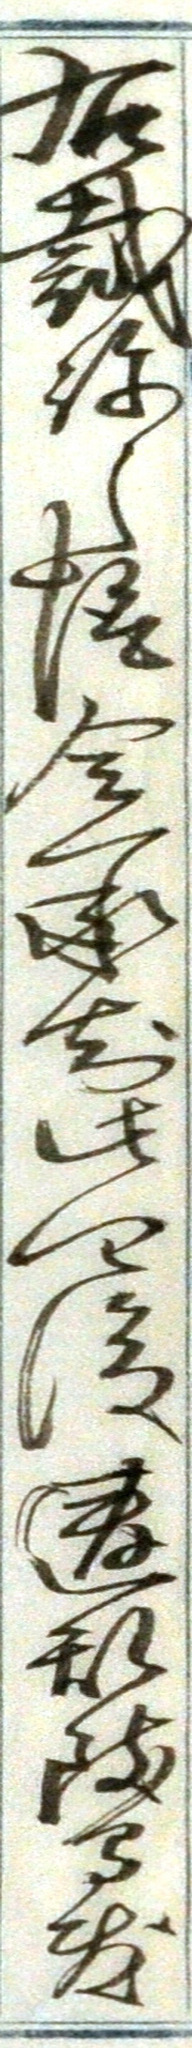右裁許之趣令承知此已後違乱致間敷
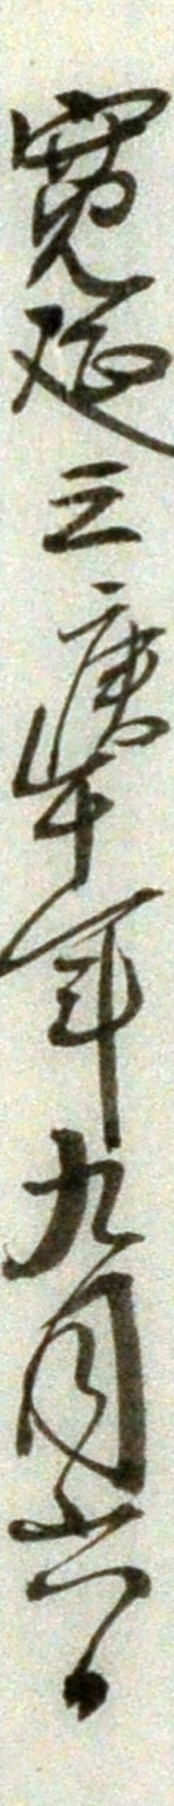寛延三庚午年九月六日
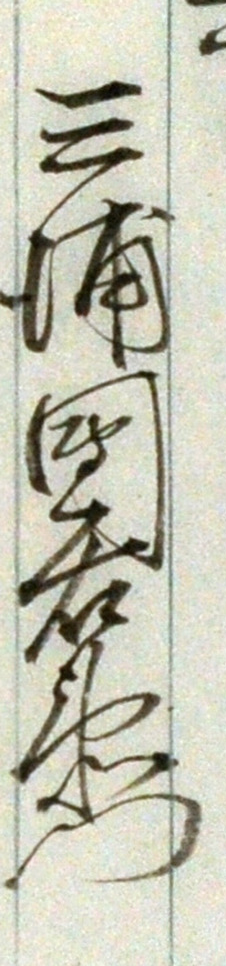三浦団右衛門
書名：鉾持村・小原村申渡裁許状
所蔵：伊那市立高遠町図書館・合同会社AMANE
